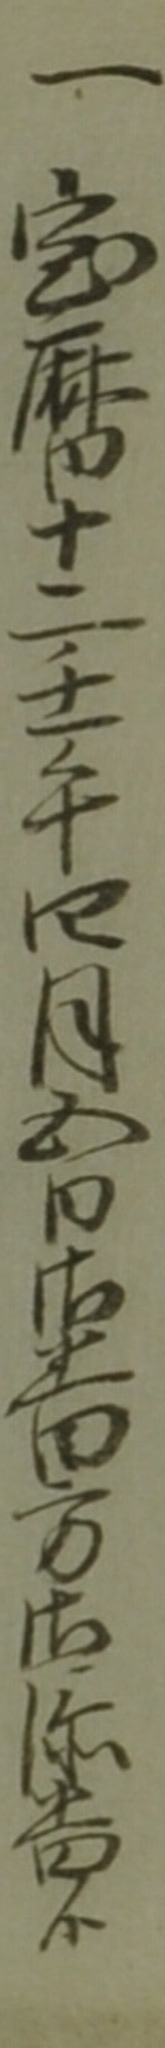一宝暦十二壬午四月五日御番方御添番ゟ
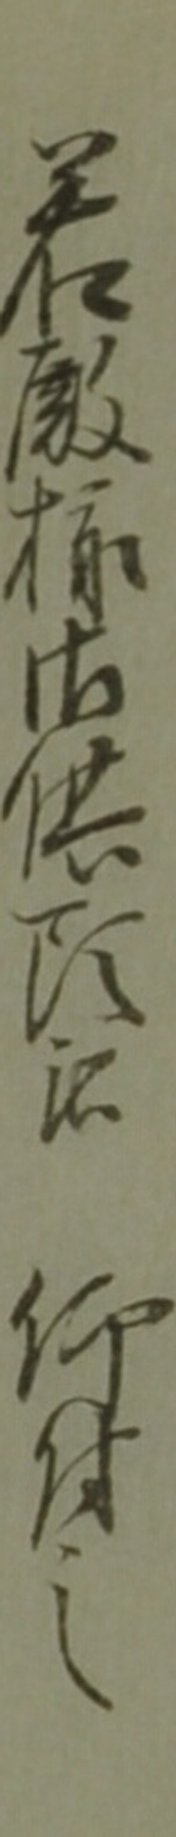若殿様御供頭被仰付之
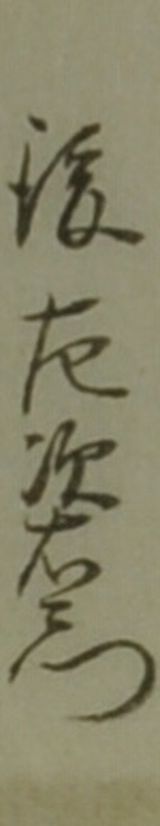後佐次右衛門
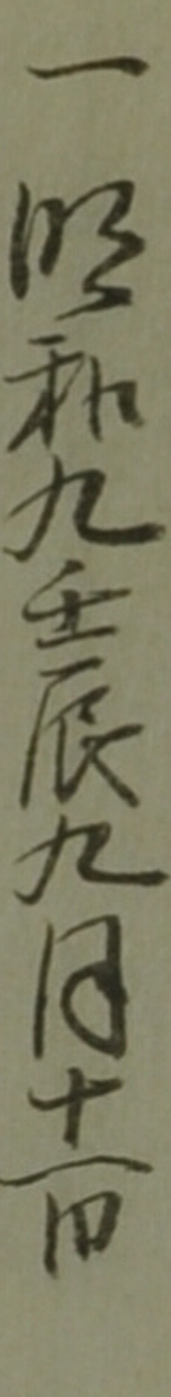一明和九壬辰九月十一日
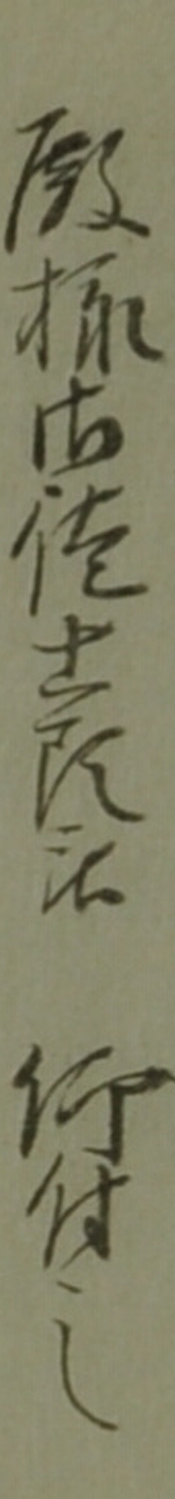殿様御徒士頭被仰付之
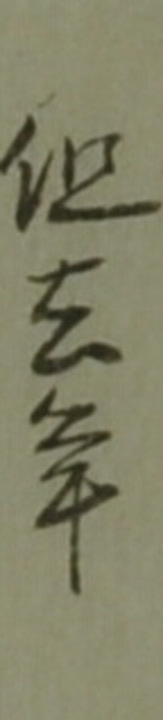但去年
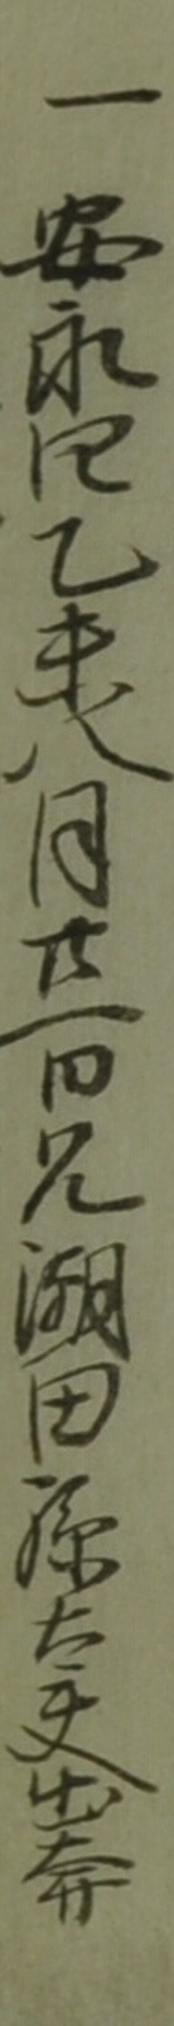一安永四乙未八月廿一日兄潮田孫太夫出奔
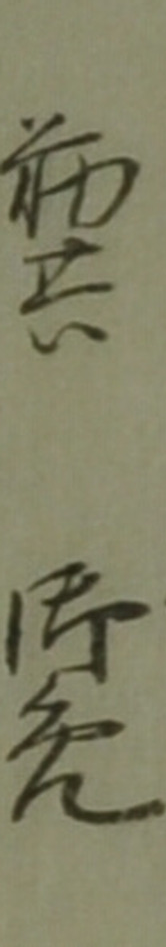勤共御免
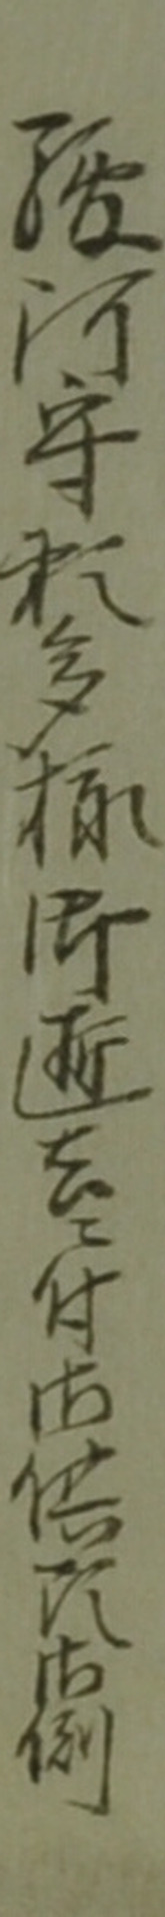駿河守於多様御逝去ニ付御供頭御側
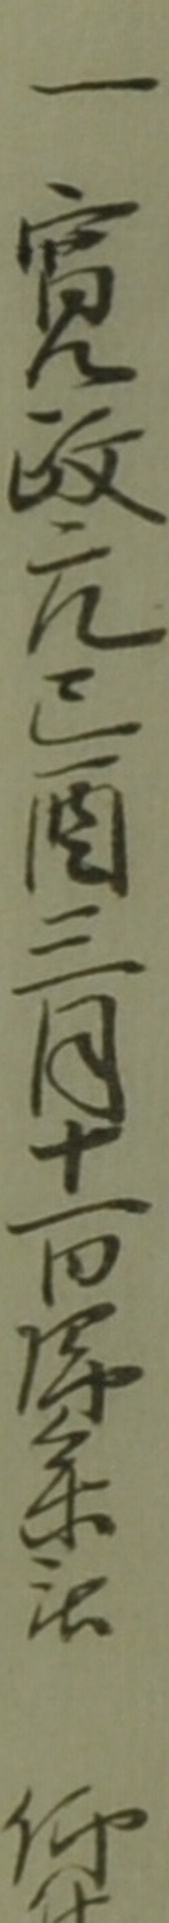一寛政元己酉三月十一日帰参被仰付之
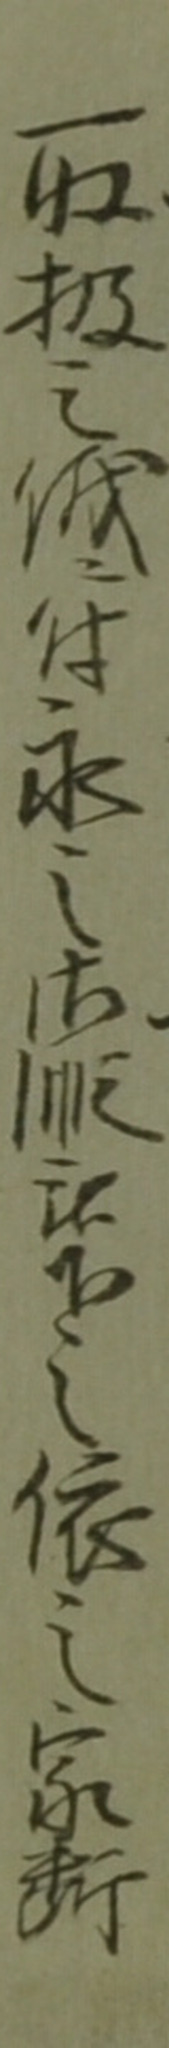取扱之儀ニ付永之御暇被下之依之家断
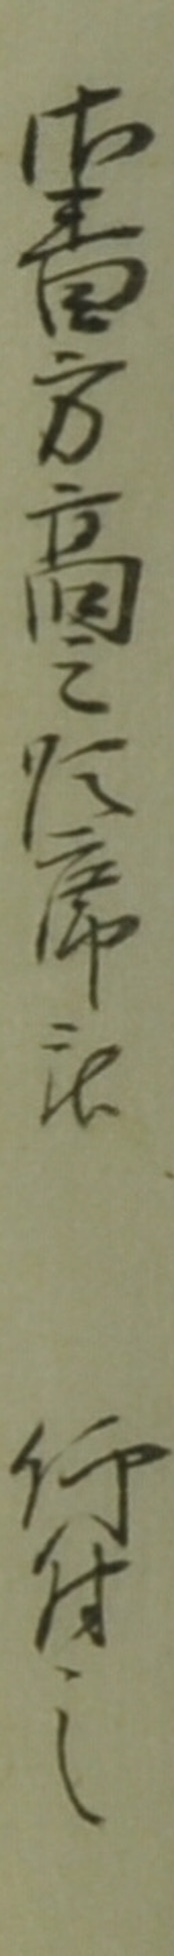御番方高之順席被仰付之

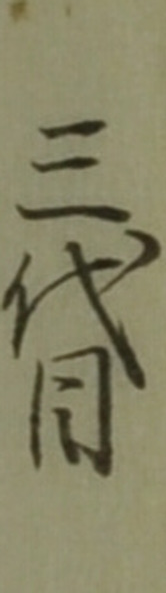三代目
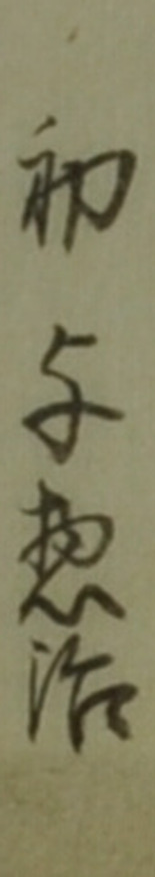初与惣治
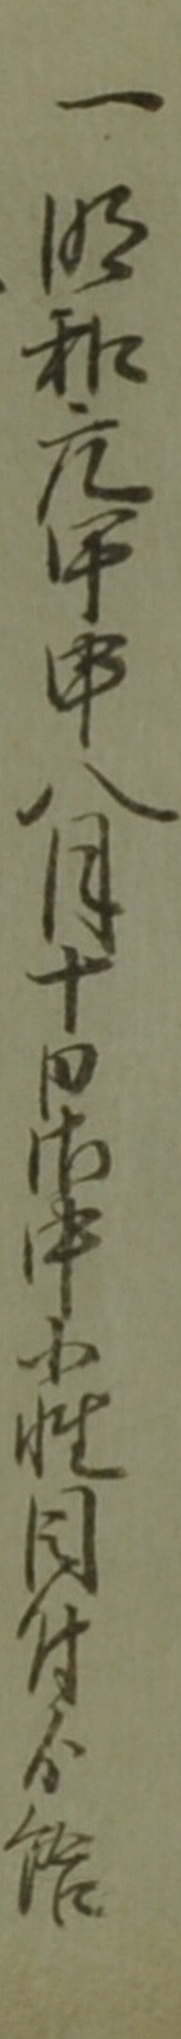一明和元甲申八月十日御中小性目付ゟ給
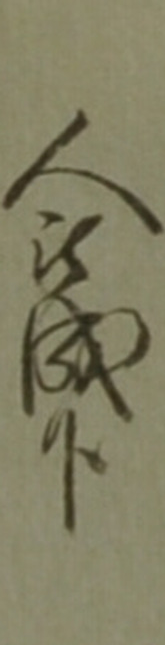人被成下
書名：諸御役代々録（六）
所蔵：伊那市立高遠町図書館・合同会社AMANE
